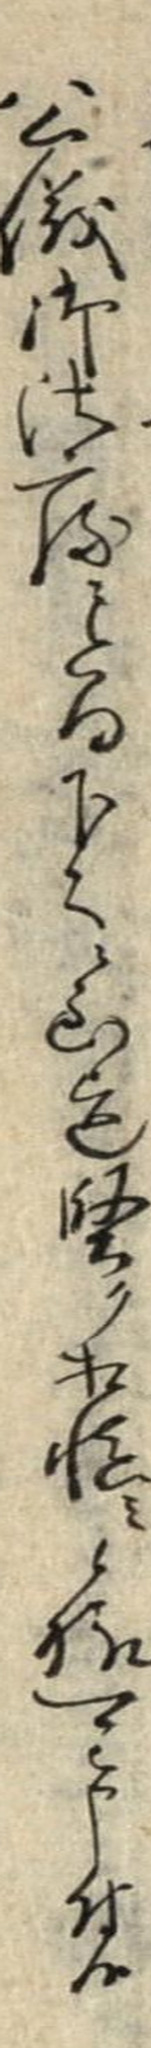公儀御法度に候間下々に至迄堅く相慎み候様可被申付候
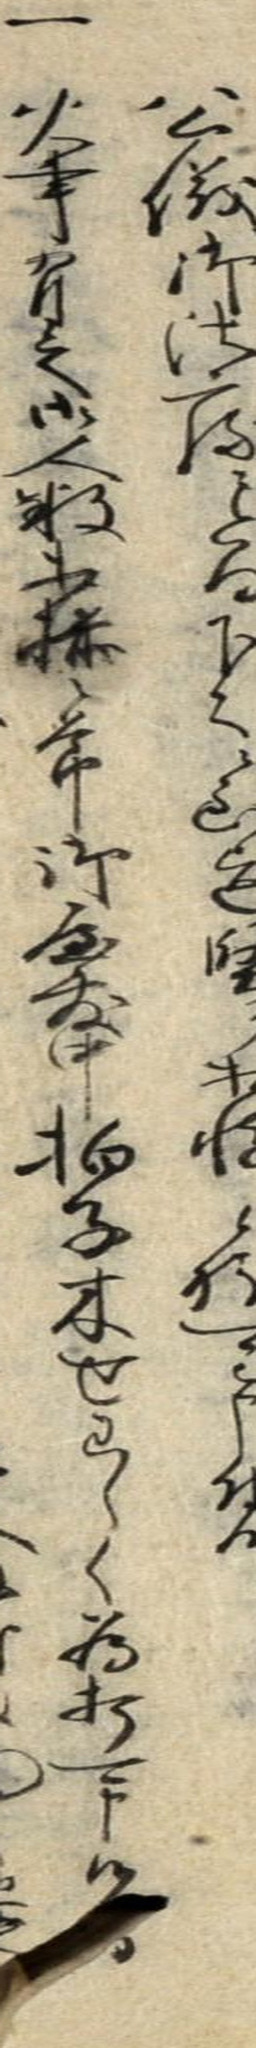一火事有之御人数相揃候節御屋敷中拍子木せわしく為打可申候
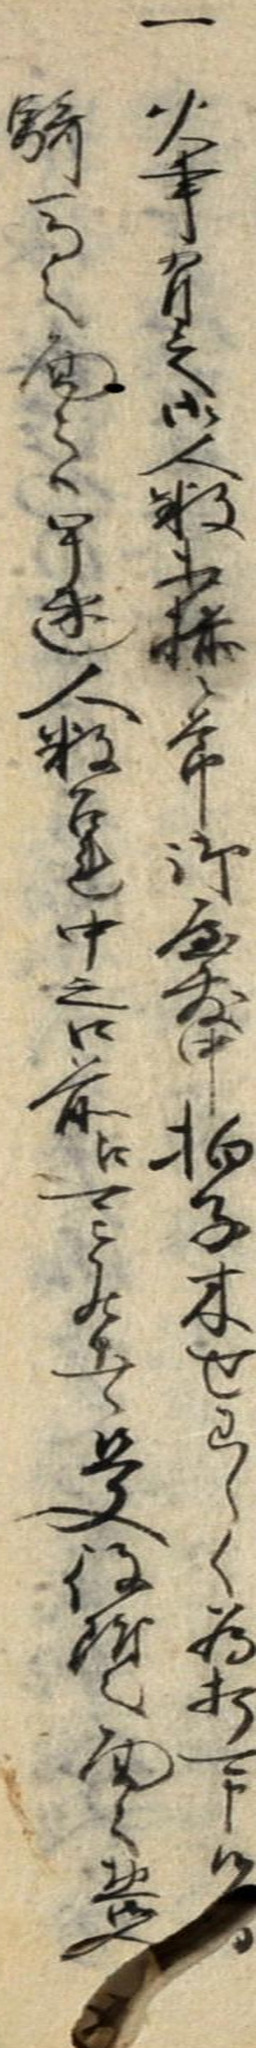騎馬之面々は早速人数召連中之口前江可被罷出候且又役附之面々惣御人

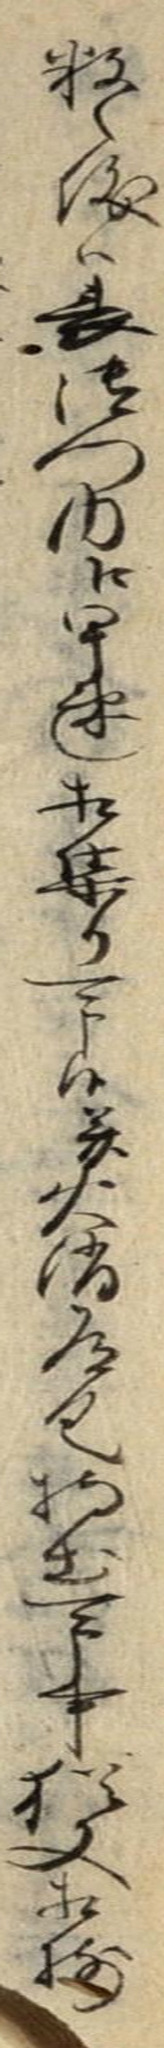数之儀は表御門内江早速相集り可申候并火消道具持出可申事猶又相揃
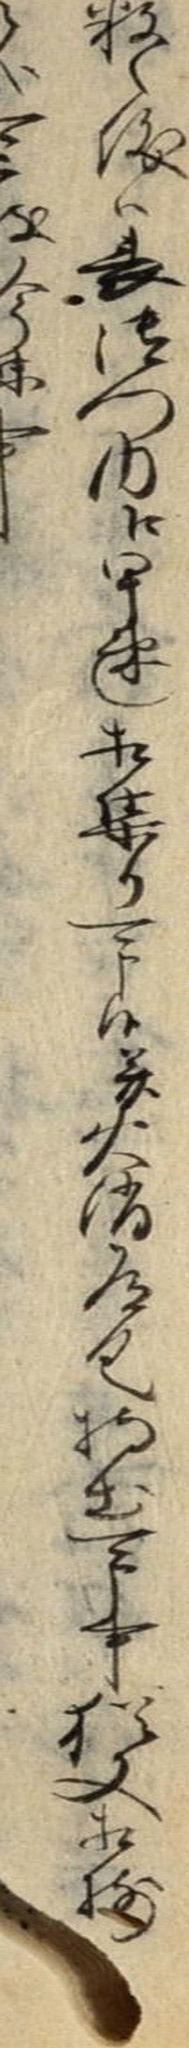数之儀は表御門内江早速相集り可申候并火消道具持出可申事猶又相揃
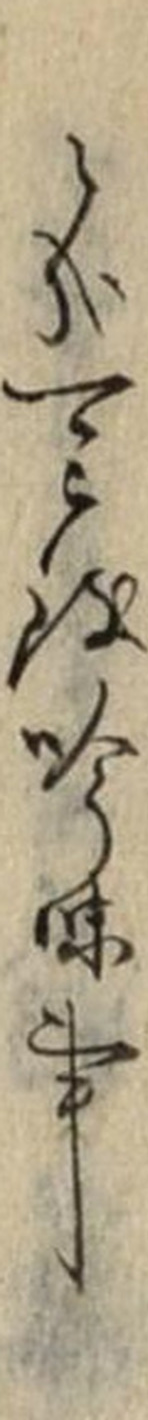候哉可被致吟味事
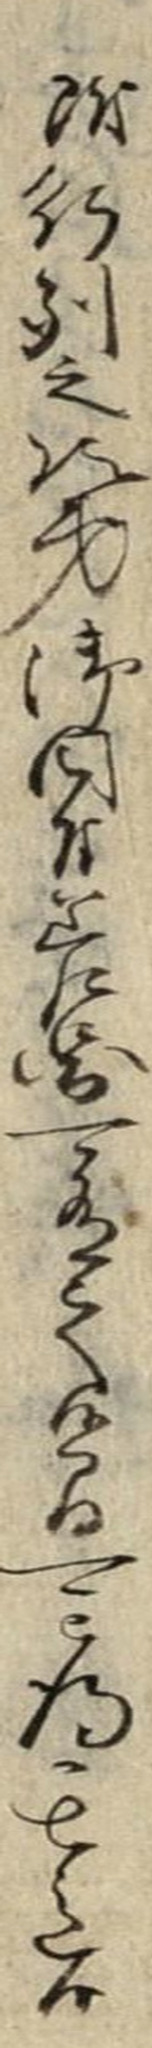附行列之次第御目付差図可有之候間可被得其意候
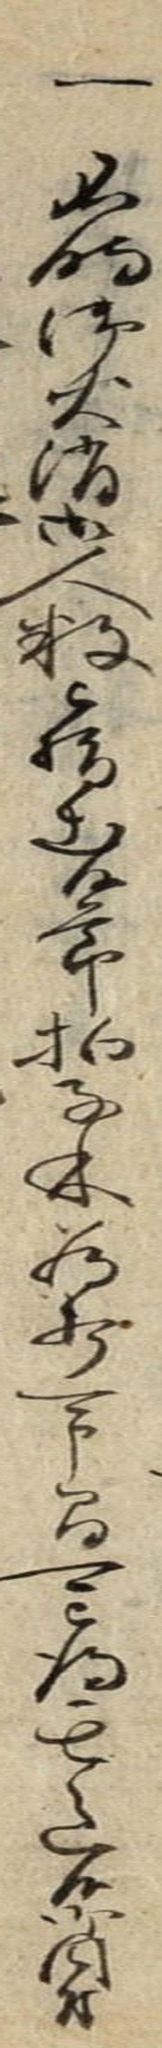一不時御火消御人数被指出候節拍子木為打可申間可被得其意候御目付
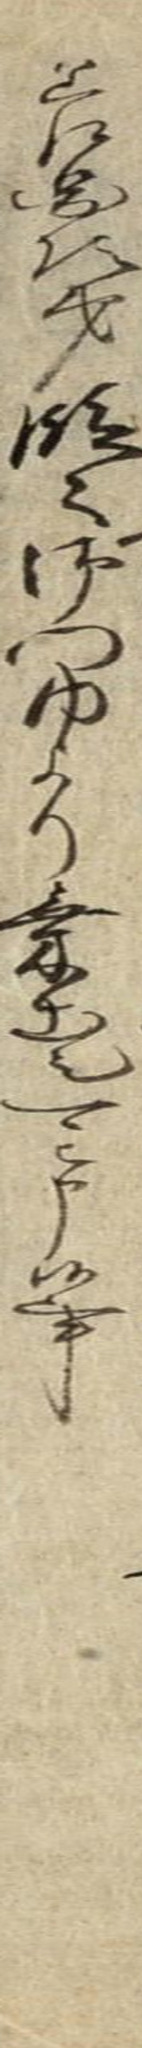差図次第段々御門内より乗出し可被申候事
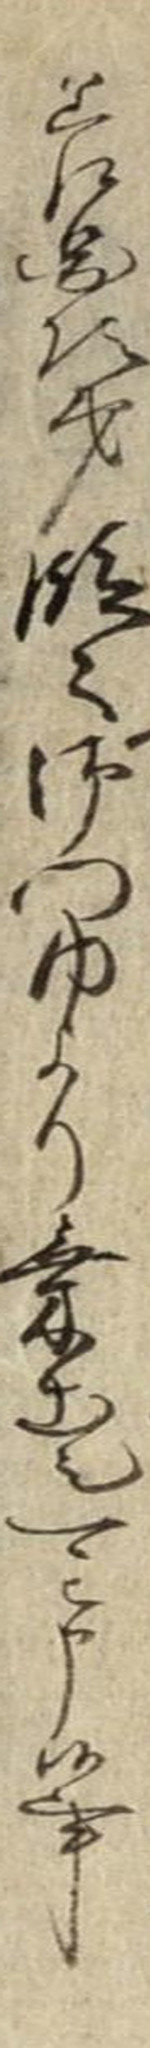差図次第段々御門内より乗出し可被申候事
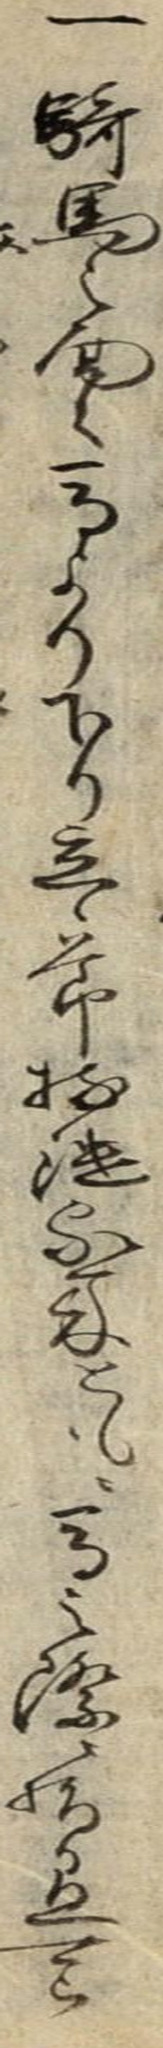一騎馬之面々馬より下り立候節持鑓家来ともに馬之際に指置可被
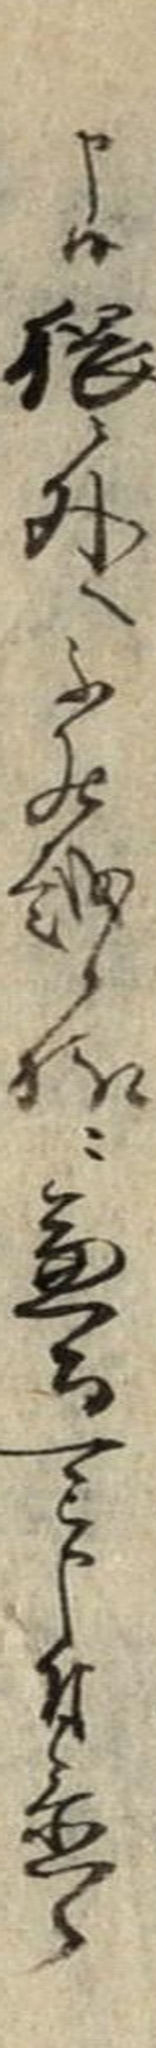申候猥に外へ不罷越候様に兼て可被申付置候
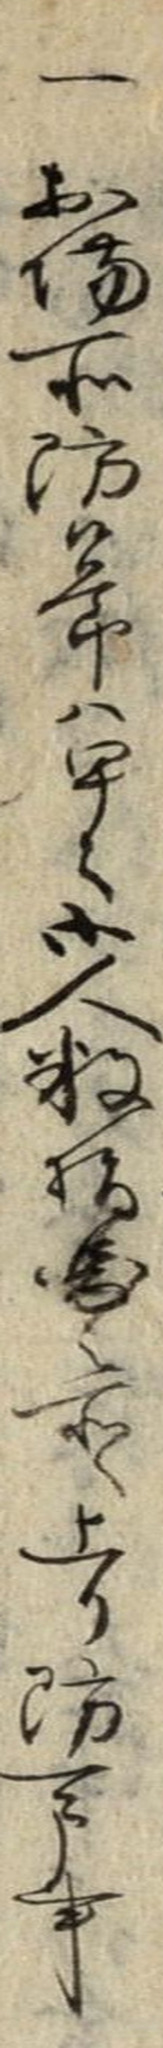一於場所防候節は早々御人数指図之所へ上り防可申事
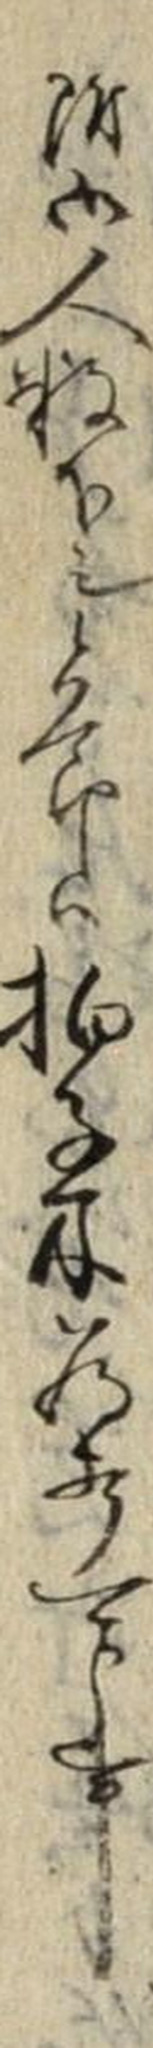附御人数下し候節は拍子木為打可申事
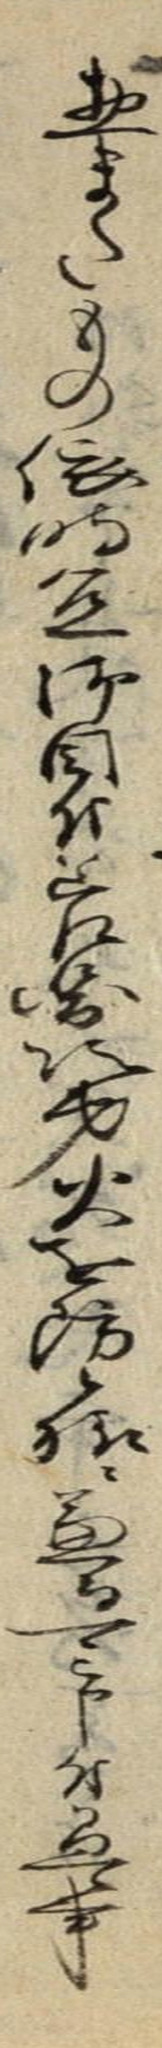一惣またもの依時宜御目付差図次第火を防候様に兼て可被申付置候事
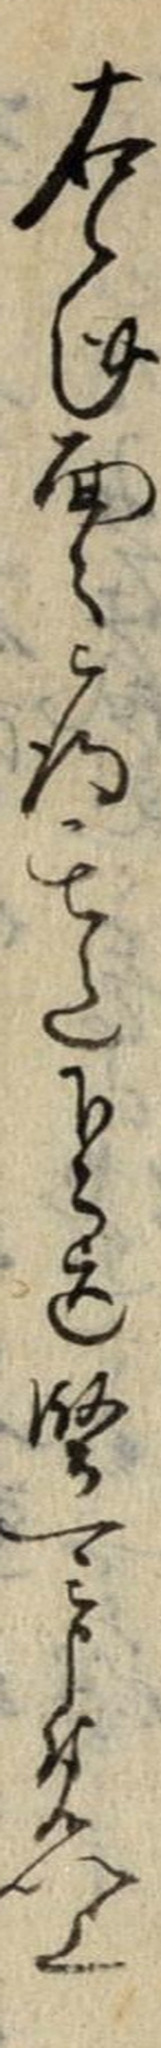右之趣面々被得其意下々迄堅可被申付候以上
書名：三都并道中之部
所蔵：福井県文書館 Fukui Prefectural Archives
